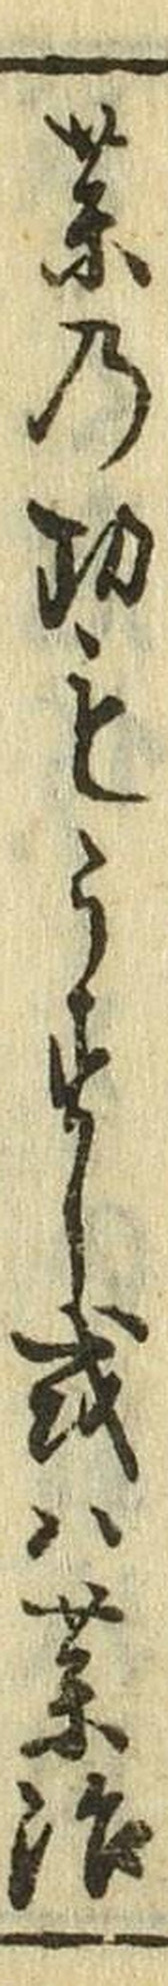薬の功もうすし或は薬治
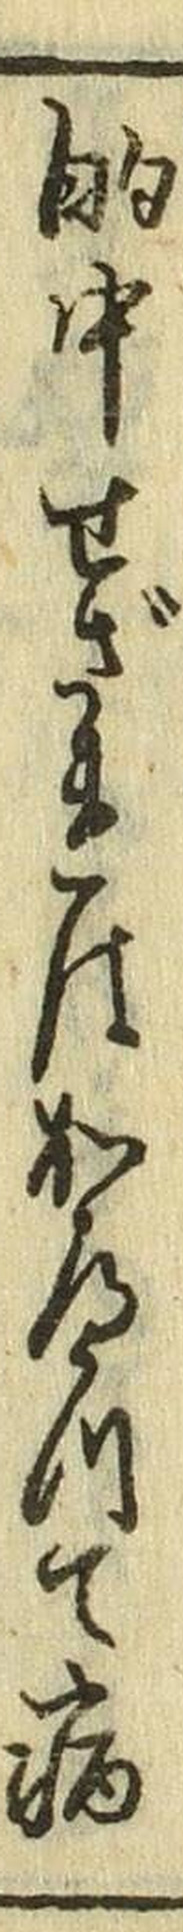的中せざれはかへつて病
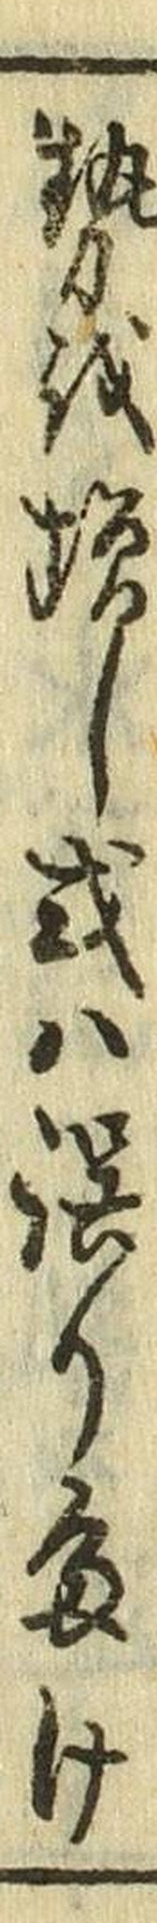勢を増し或は誤り多け
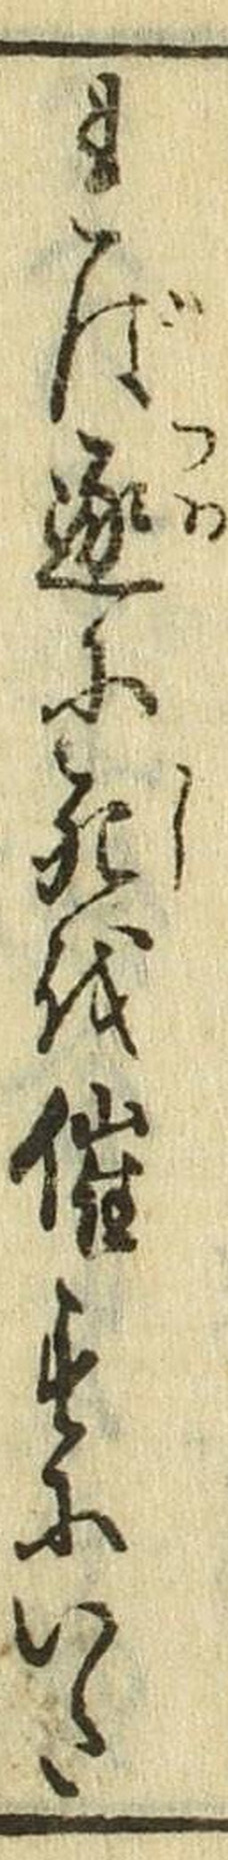れば遂に死を催すにいた
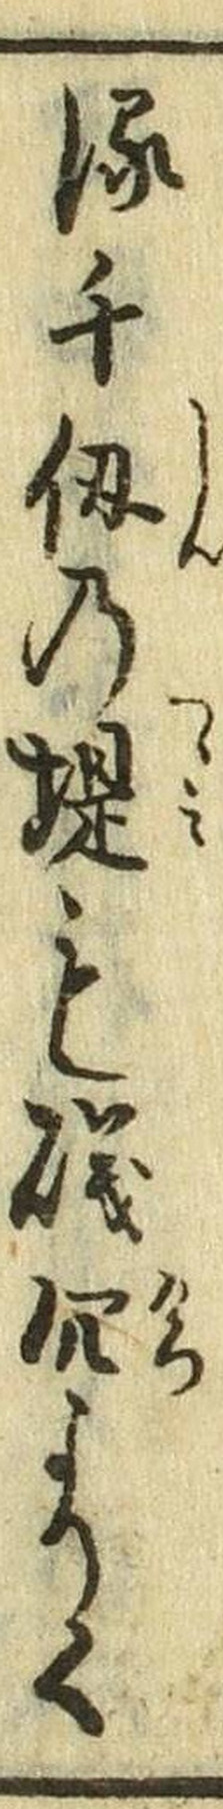る千仞の堤も蟻穴よりく
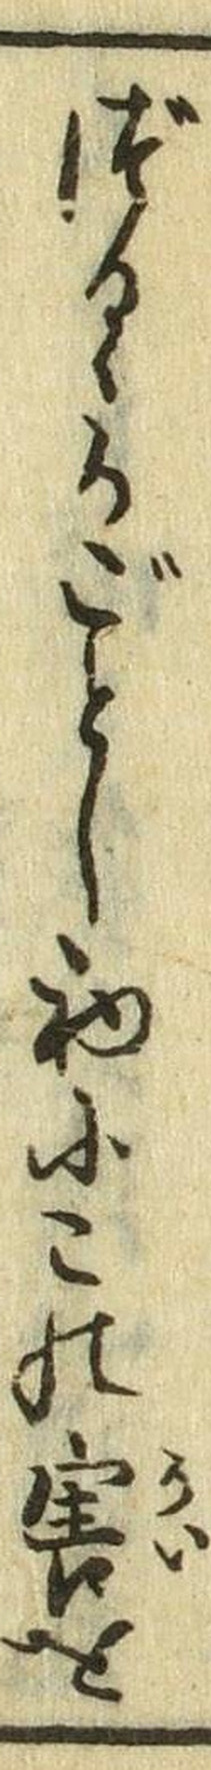づるゝかごとし初にこの害を
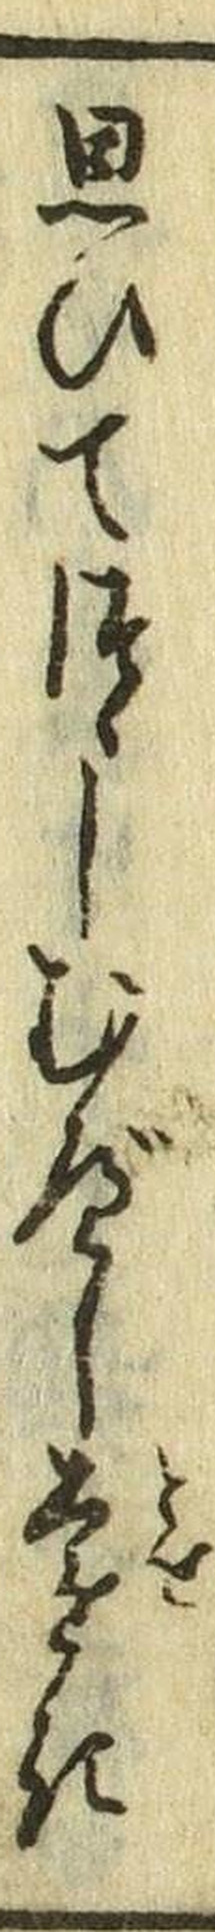思ひてつゝしむべし遠き
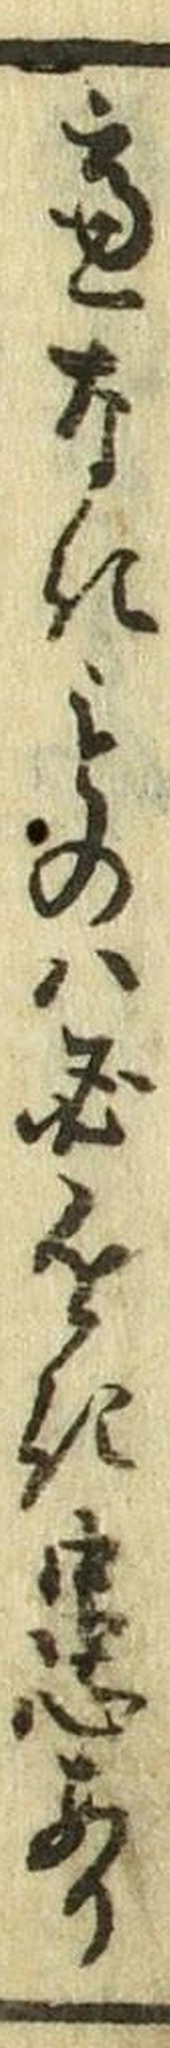慮なきものは必近き患あり
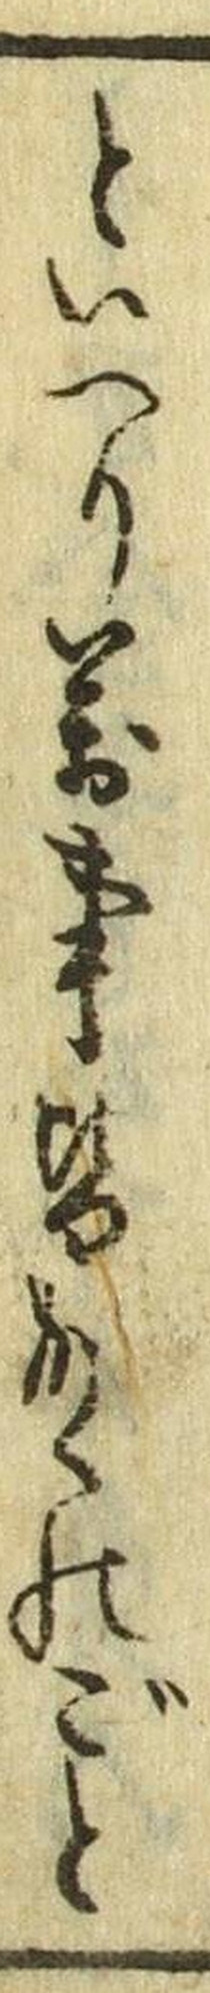といへり万事皆かくのごと

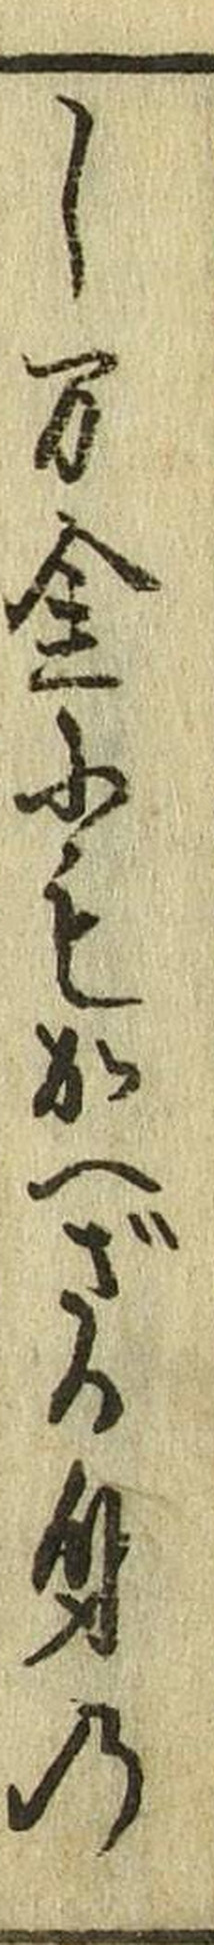し万金にもかへざる身の
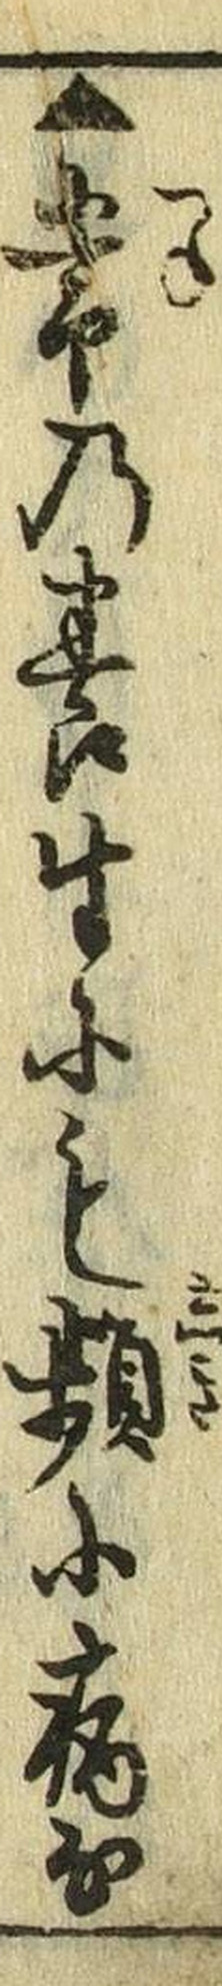▲常の養生にも頻に病な
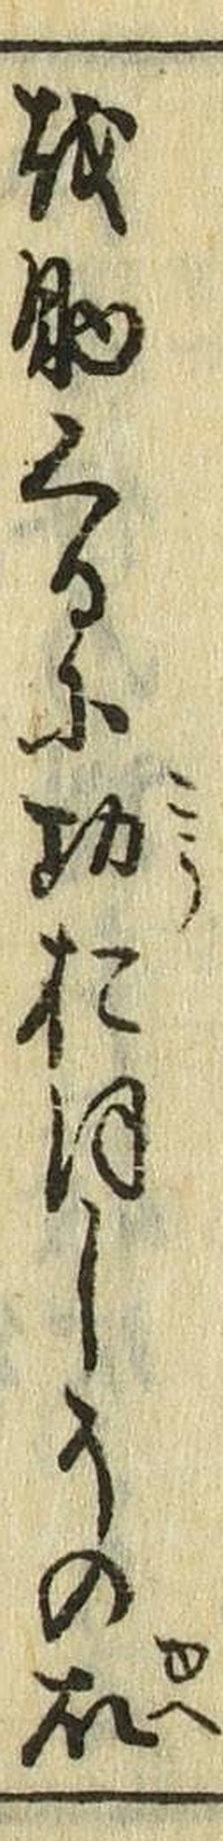を助くるに功おほしその故
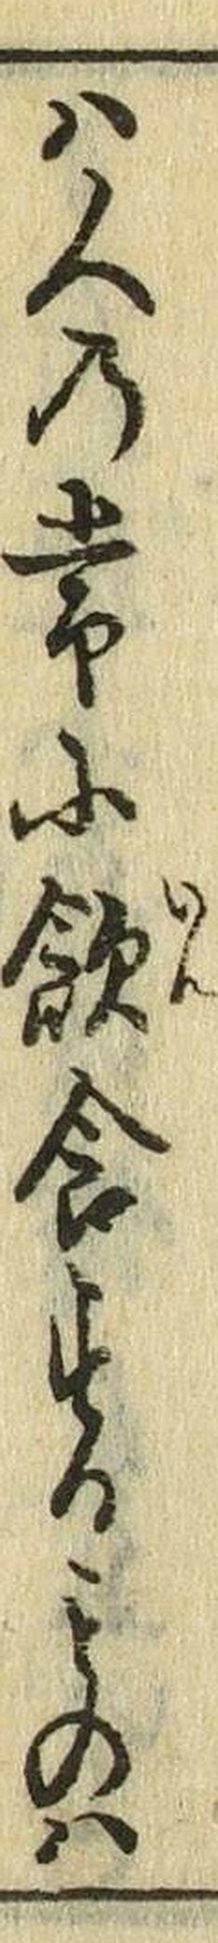は人の常に飲食するものは
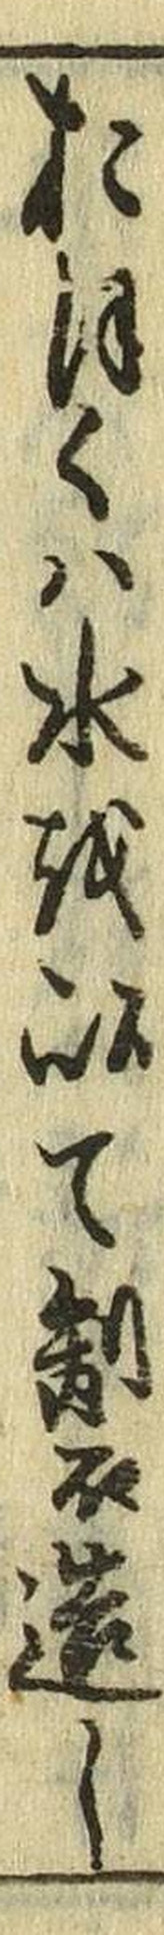おほくは水を以て製造し
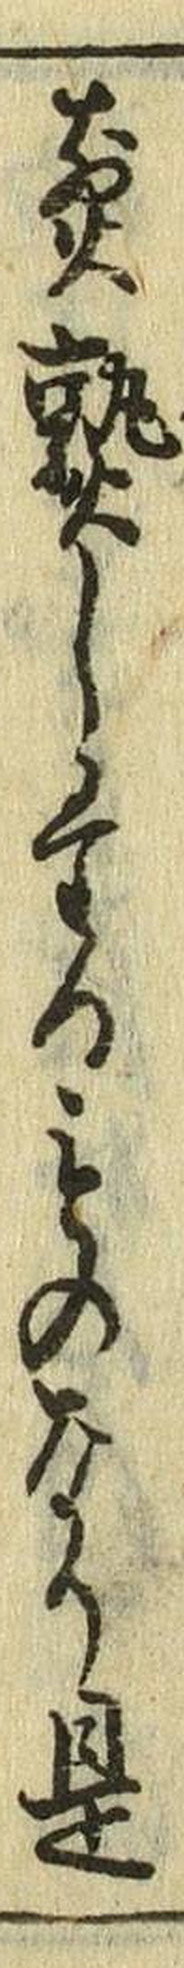煎熟したるものなり是
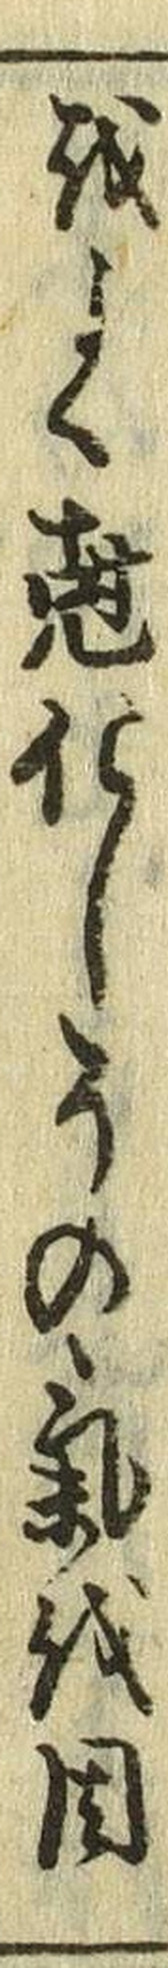をよく剋化しその気を周
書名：居家養生記
